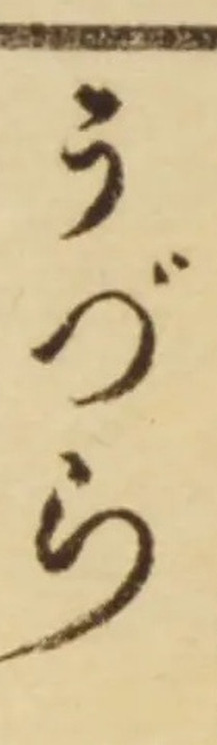うづら
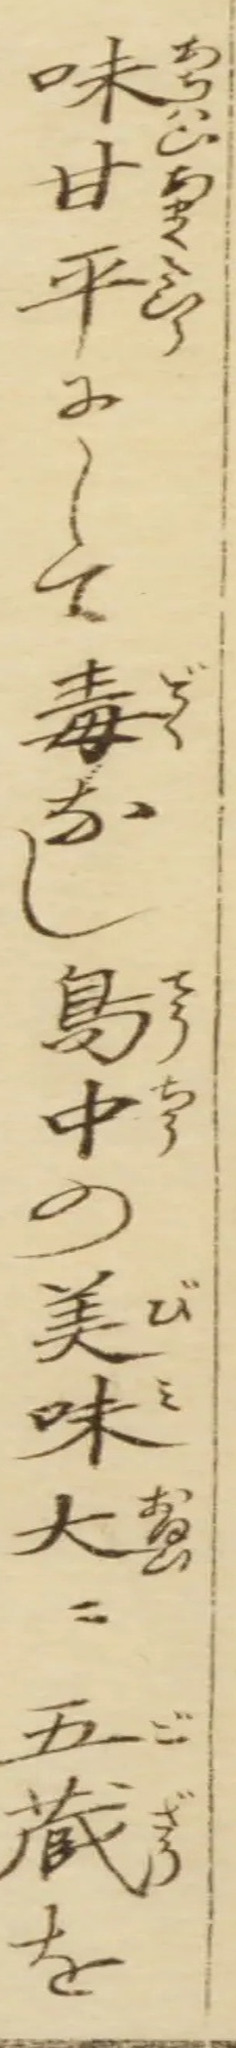味甘平にして毒なし鳥中の美味大に五蔵を
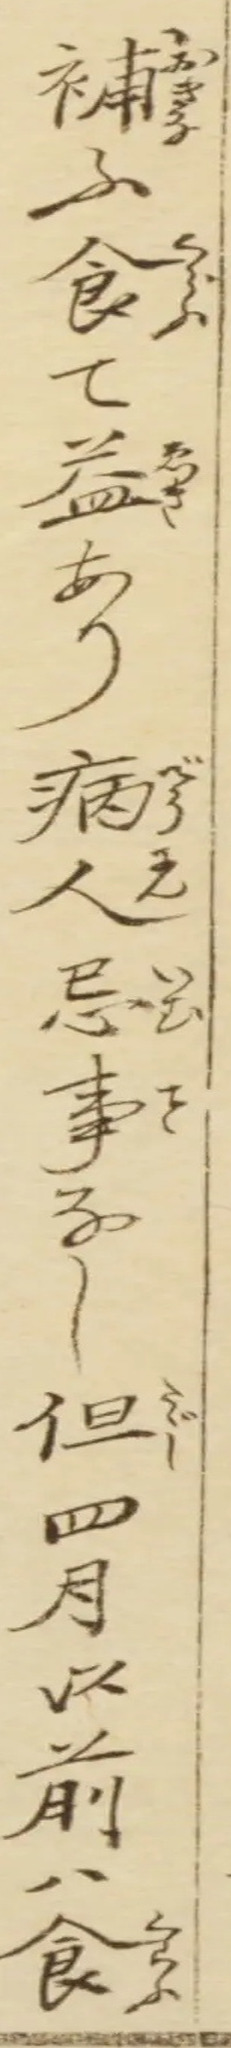補ふ食て益あり病人忌事なし但四月以前は食
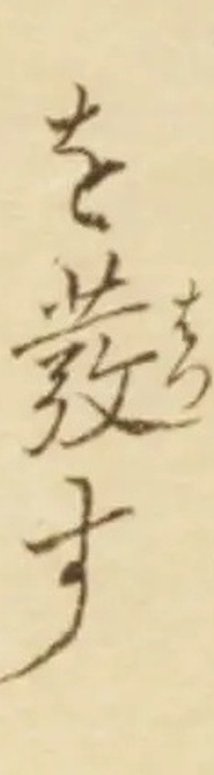を発す
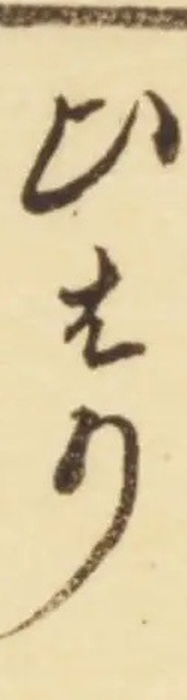ひはり

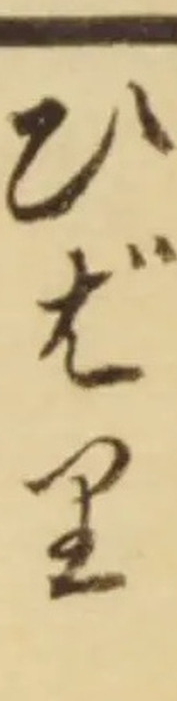ひばり
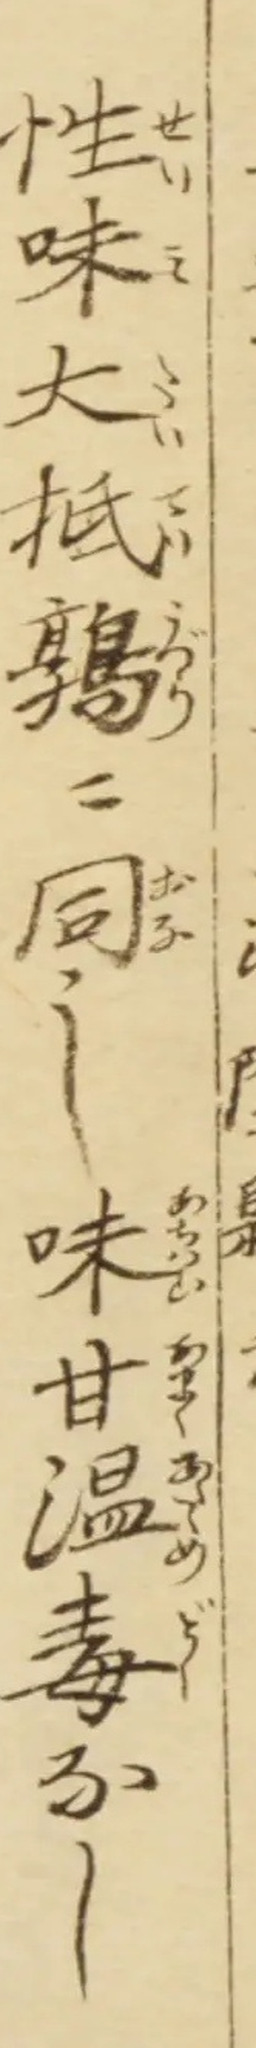性味大抵鶉に同し味甘温毒なし
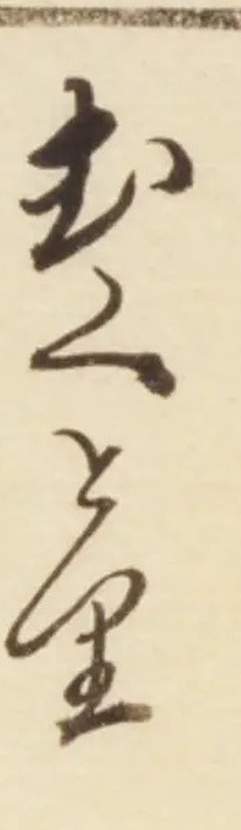むくとり

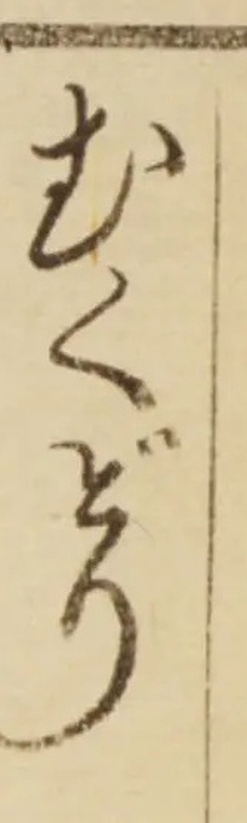むくどり
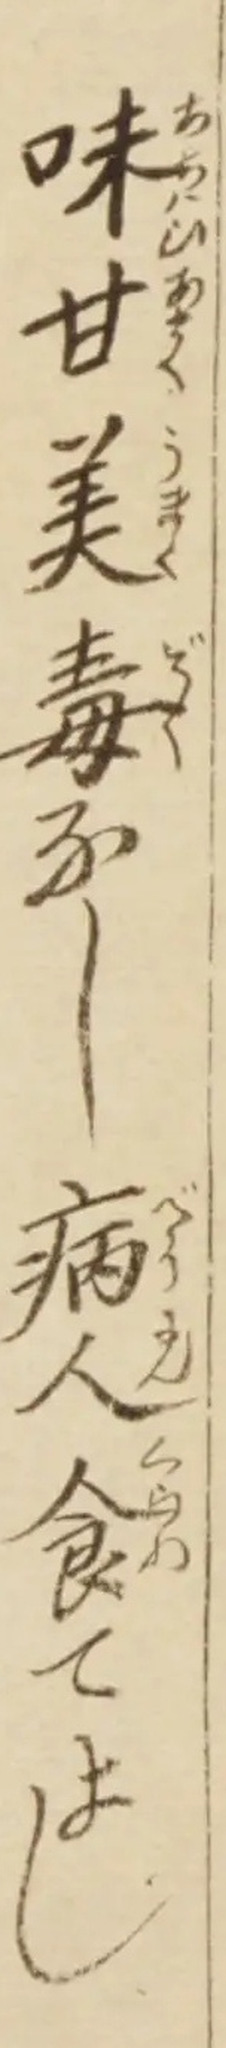味甘美毒なし病人食てよし

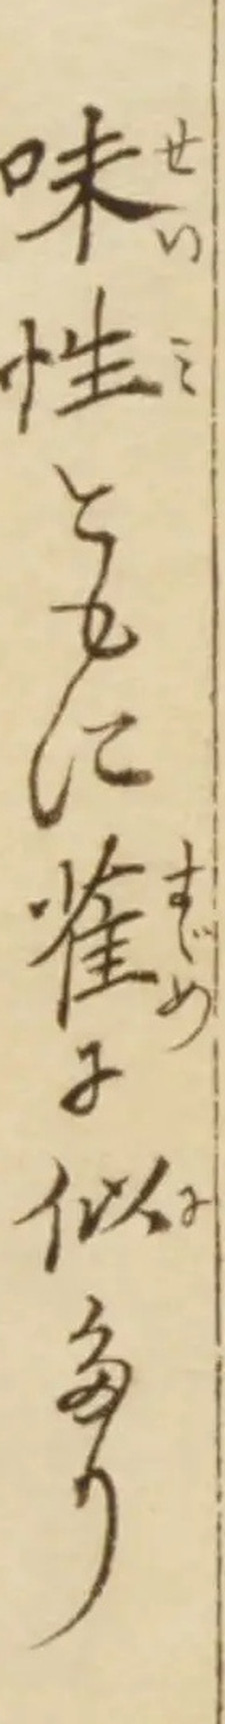性味ともに雀に似たり
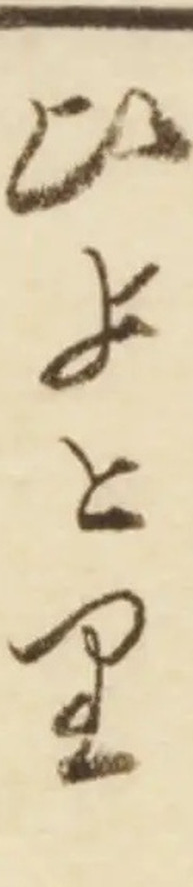ひよとり

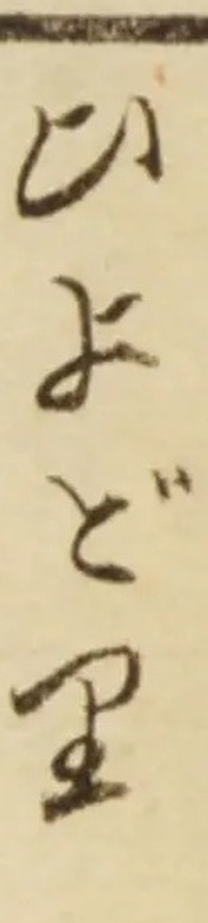ひよどり
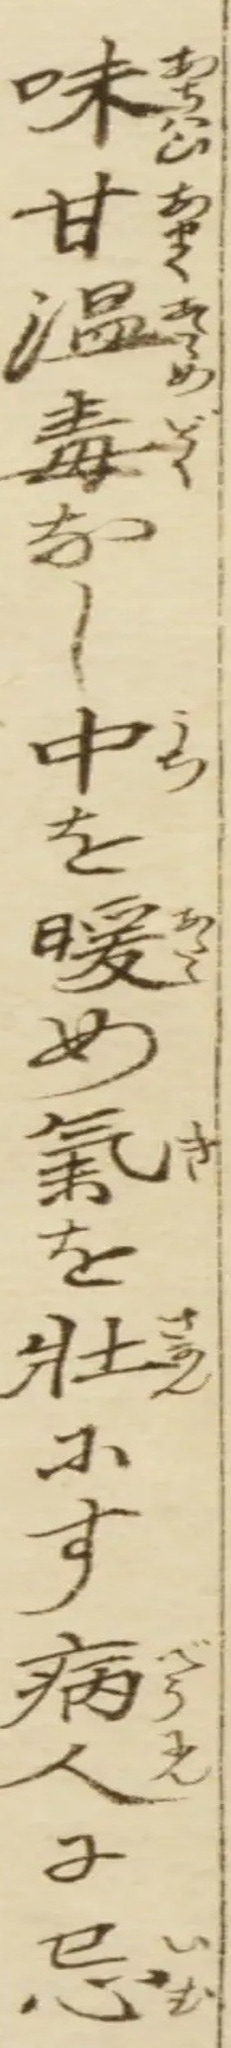味甘温毒なし中を暖め気を壮にす病人に忌
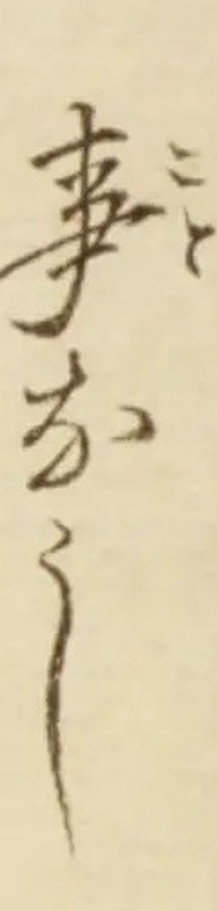事なし
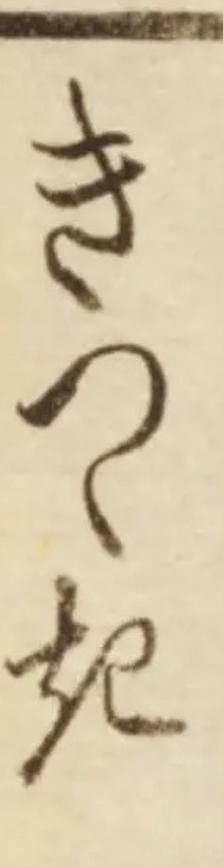きつゝき
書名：華鳥譜
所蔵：国立国会図書館 National Diet Library, JAPAN
